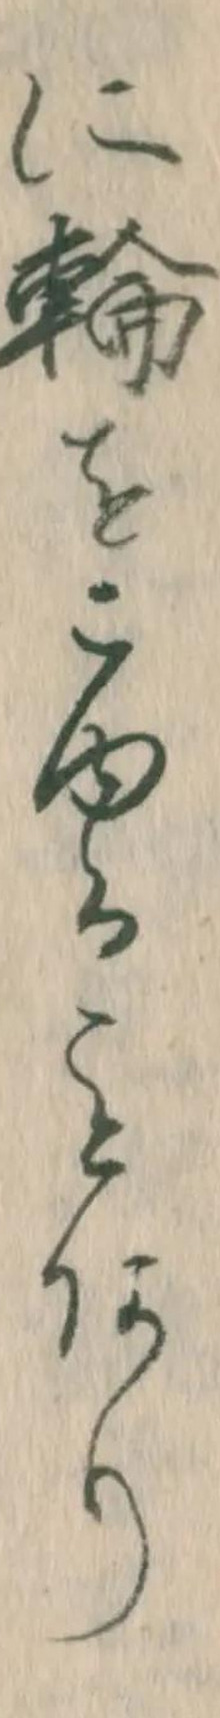に輪をこゆることあり
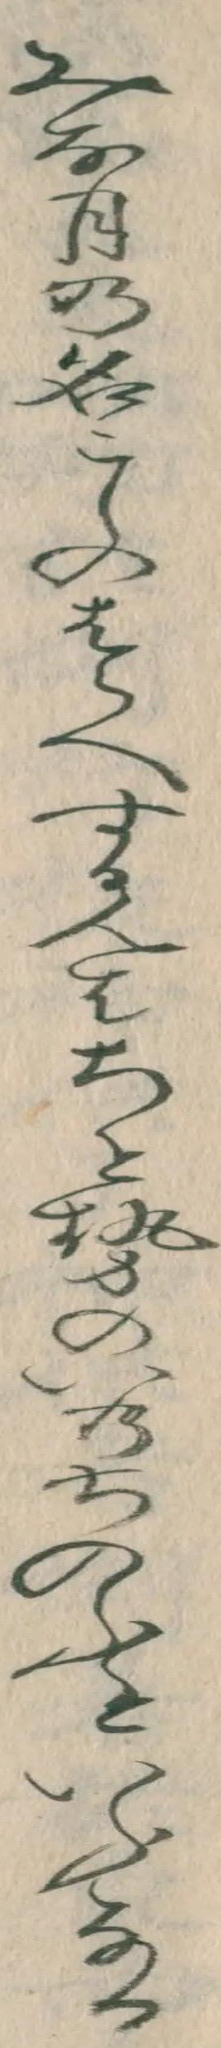みな月のなこしのはらへする人はちとせのいのちのふといふなり
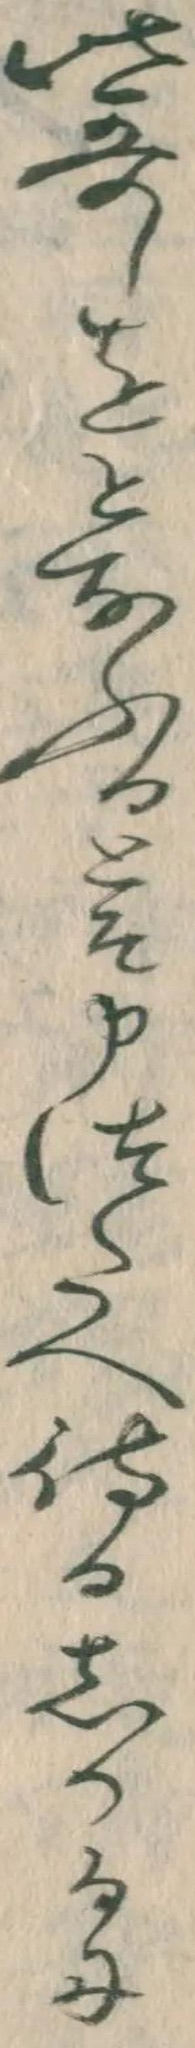此哥をとなふるとそ申つたへ待るしかるに
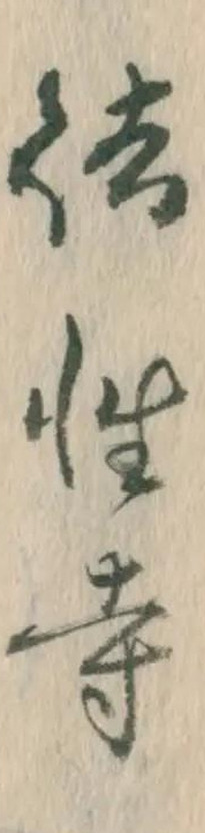法性寺

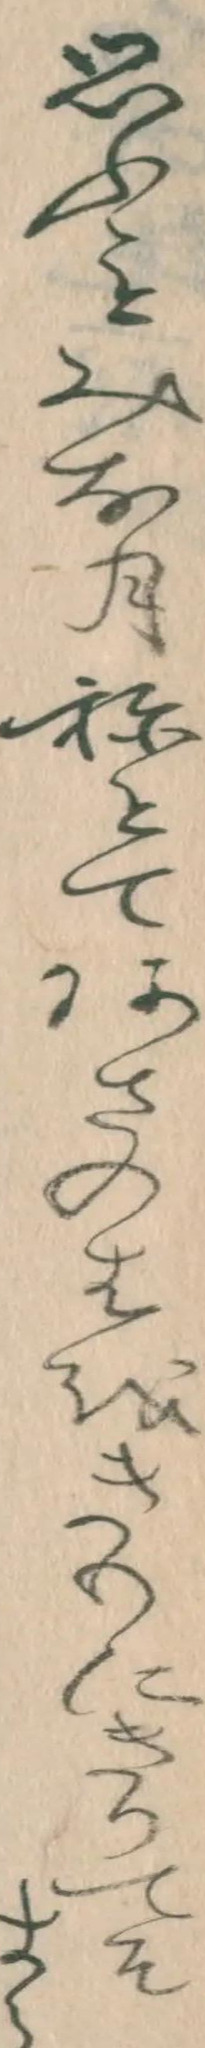思ふことみな月ねとてあさのはをきりにきりてそ
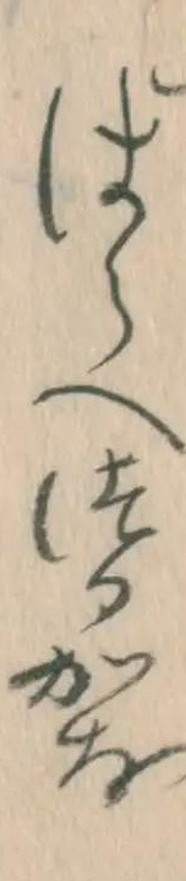はらへつるかな
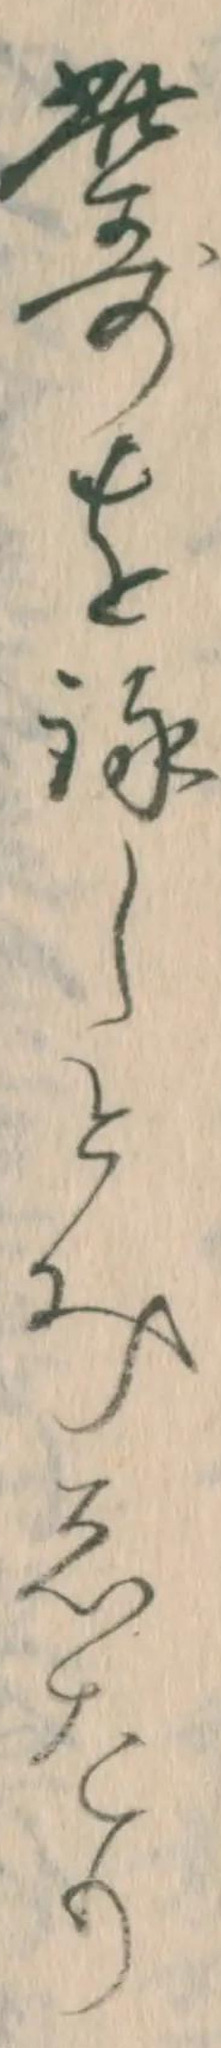此哥を詠しとみゑたり
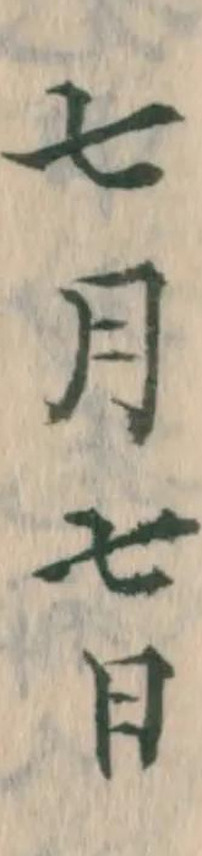七月七日
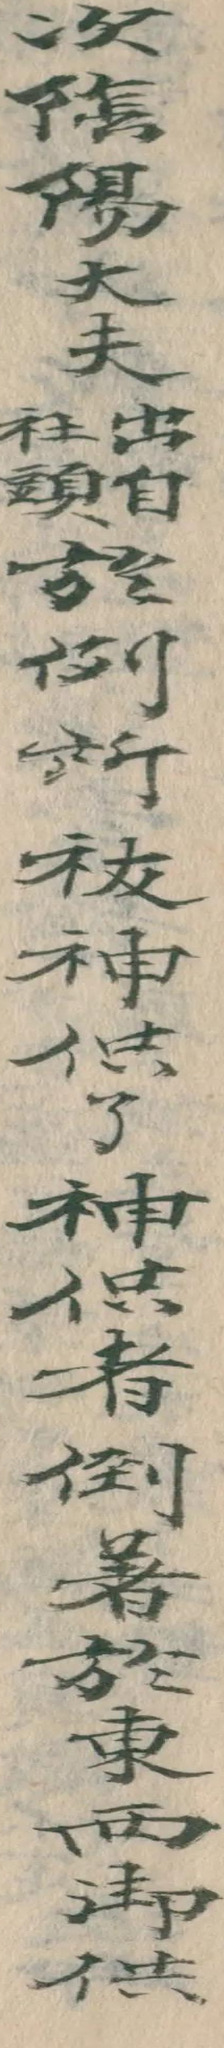次陰陽大夫出自社頭於例所祓神供了神供者倒着於東西御供
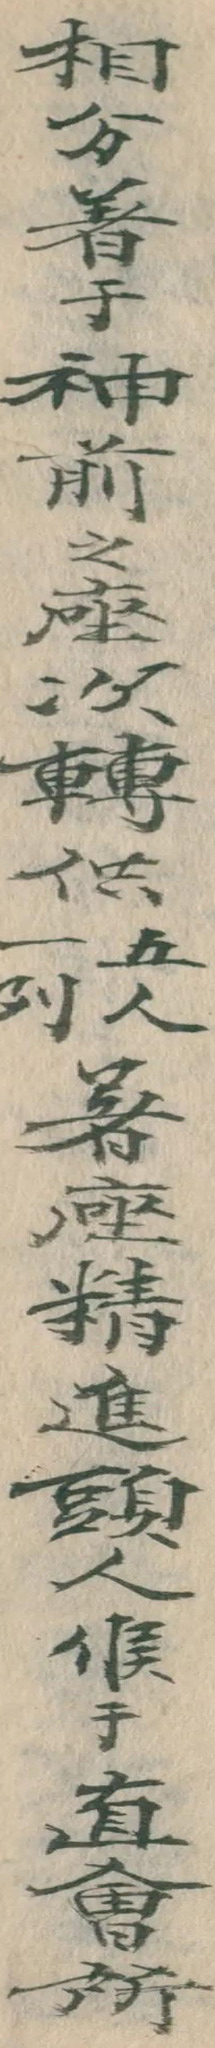相分着于神前之座次転供五人一列着座精進頭人候于直会所

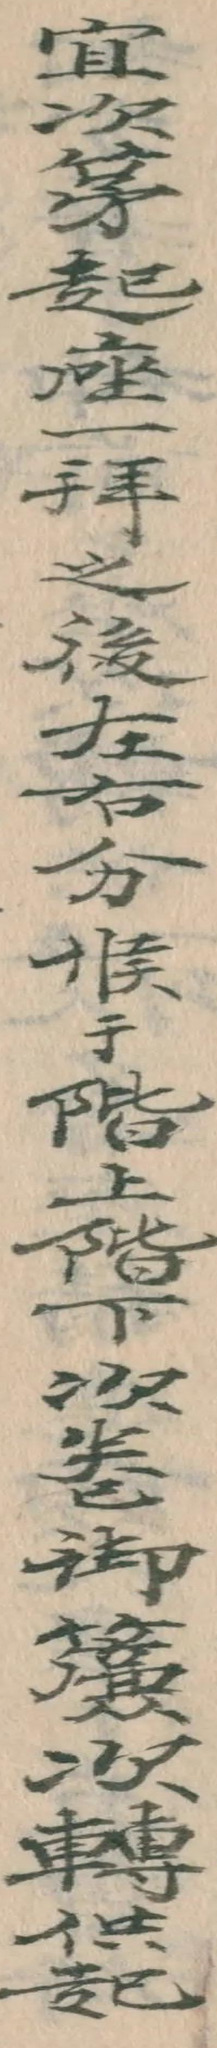宜次第起座一拝之後左右分候于階上階下次巻御簾次転供起
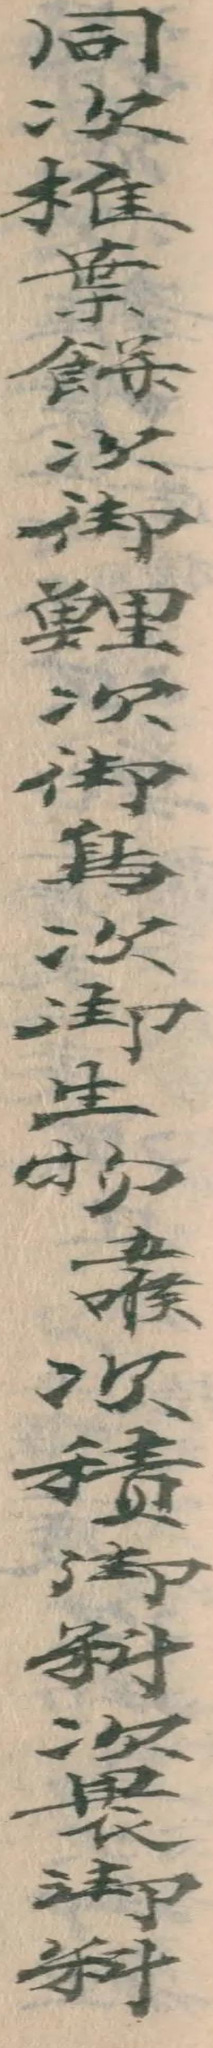同次椎葉餅次御鯉次御鳥次御生物五喉次積御料次褁御料

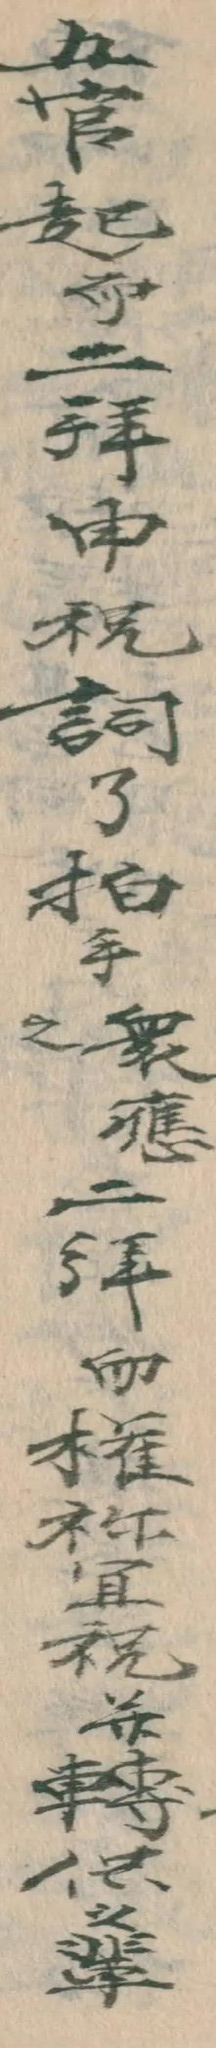五官起而二拝申祝詞了拍手衆応之二拝而権祢宜祝并転供之輩
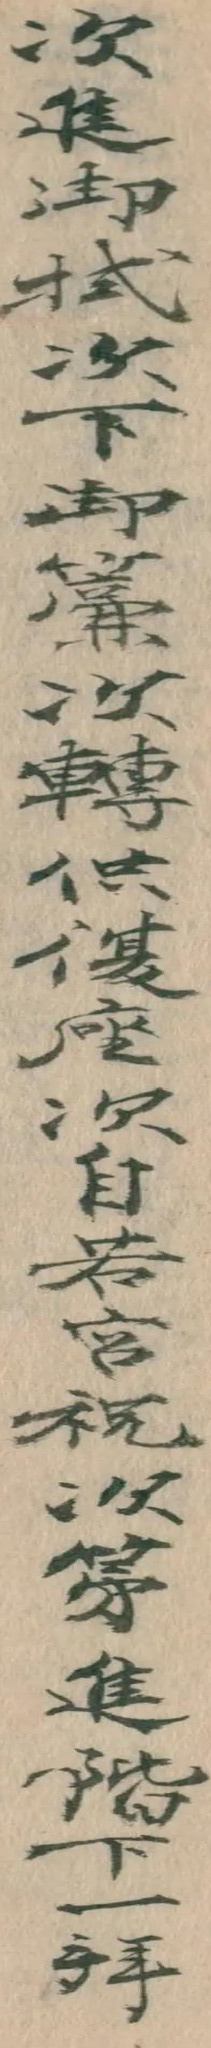次進御拭次下御簾次転供復座次自若宮祝次第進階下一拝
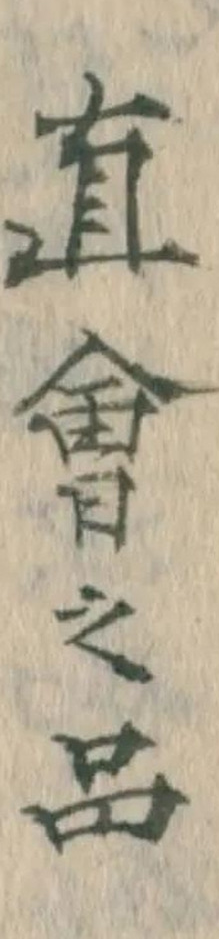直会之品

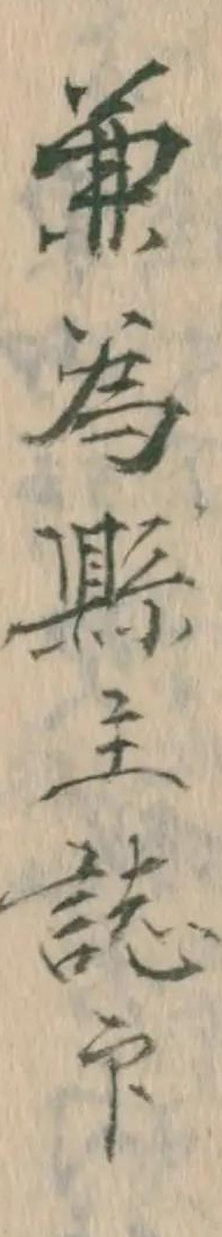兼為県主誌印
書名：賀茂社記録. 第9冊
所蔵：国立国会図書館 National Diet Library, JAPAN
